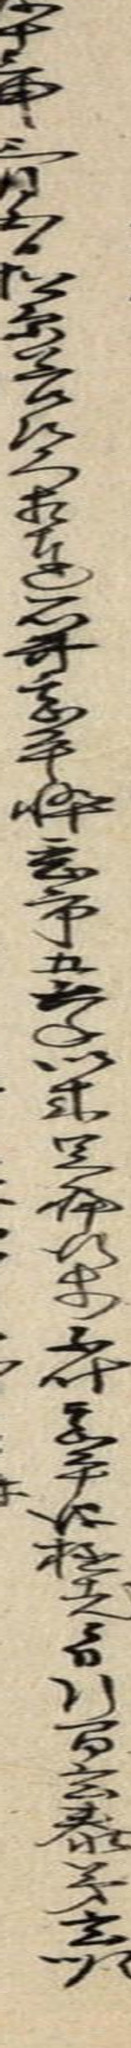一享保十三申三月五日松原善左衛門相達石井甚平忰甚市五六年以来足痛行歩不叶甚平儀極老ニ付引間玄泰弟玄順
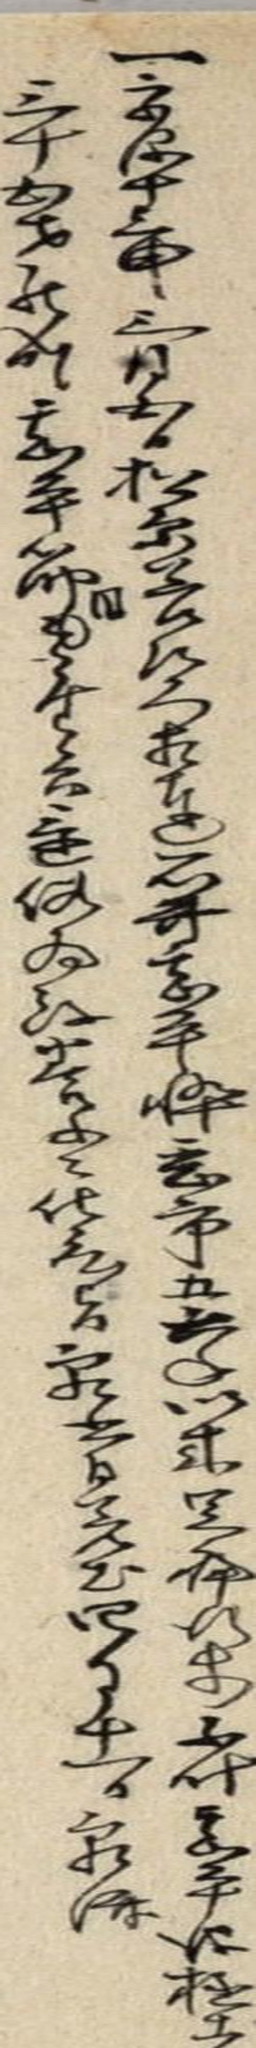三十五才罷成候甚平筋目も御座候間還俗為致養子ニ仕度旨願書付差出四月十一日願済
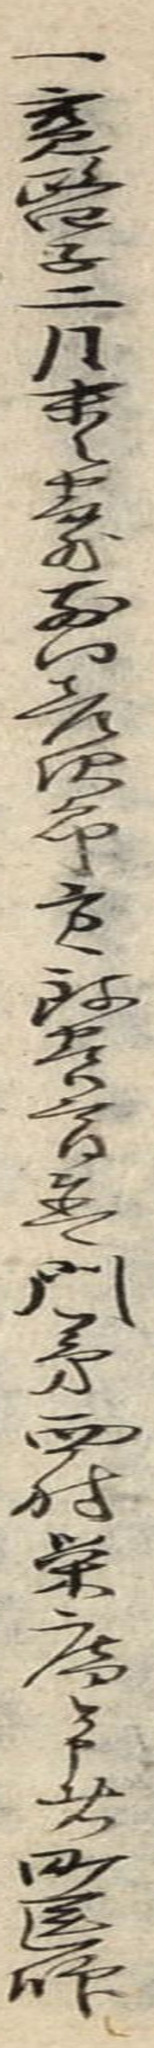一寛政四子二月末之番外前田彦次郎方へ致養育置候門弟西村栄庵と申者町医師
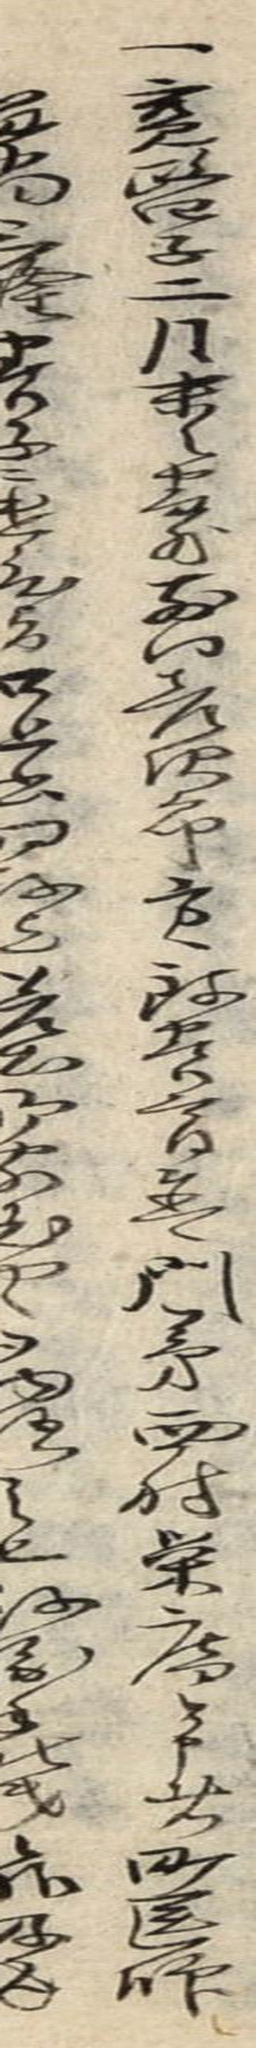梁田三隆養子ニ遣度旨口上書同役迄差出御家老中へ御物語之上致勝手次第
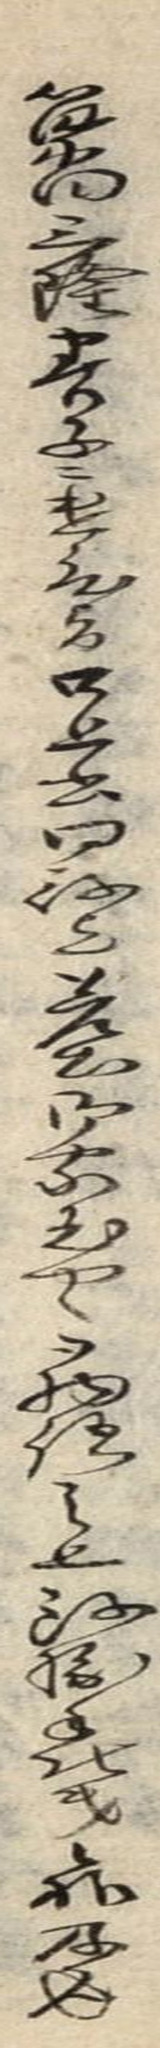梁田三隆養子ニ遣度旨口上書同役迄差出御家老中へ御物語之上致勝手次第
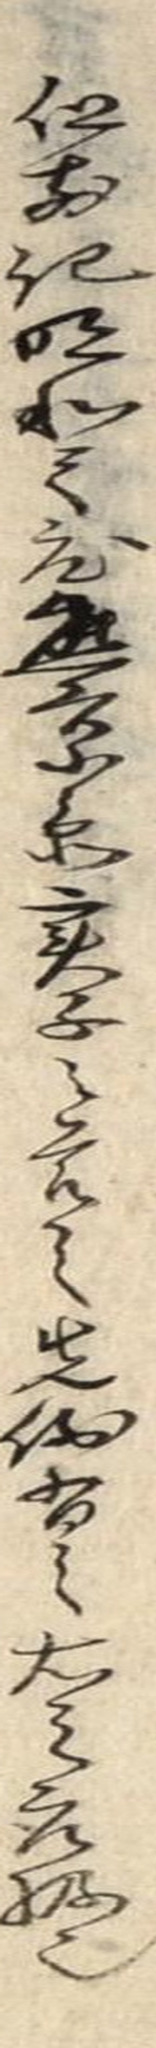但前記明和之度熊谷小兵衛実子之節之先例有之右之取扱也
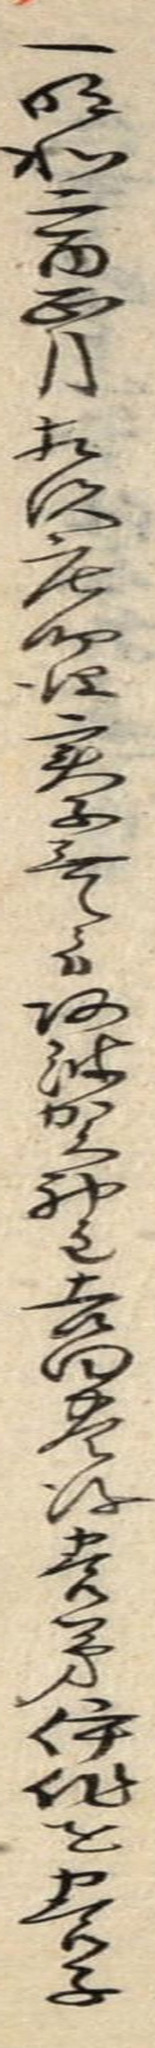一明和二酉正月相沢庄助儀実子無之ニ付阿波賀神主吉田豊後養弟伊作を養子

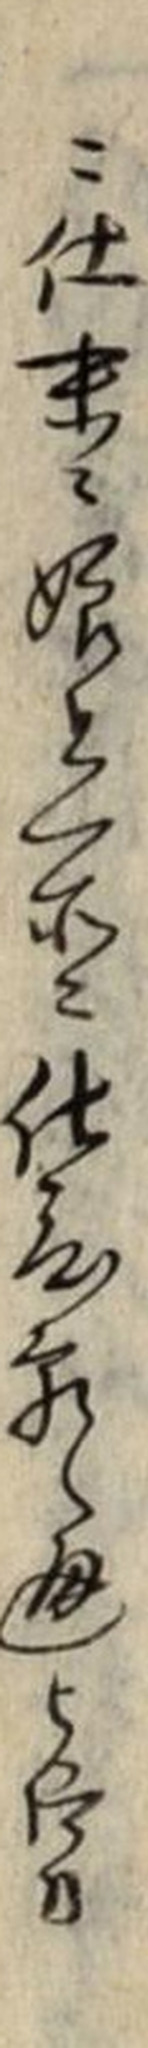ニ仕末々娘と一所ニ仕度願之通被仰付
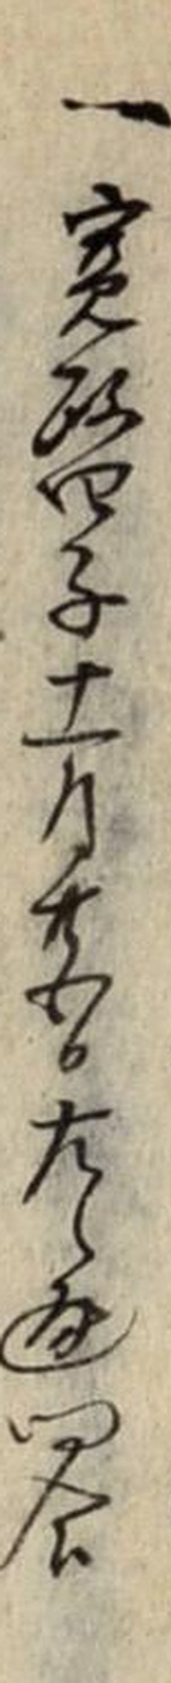一寛政四子十一月廿五日左之通問合
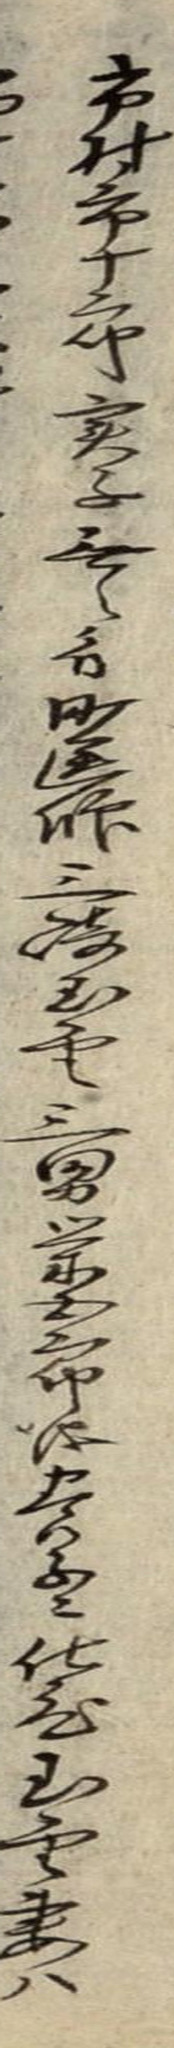市村市十郎実子無之ニ付町医師三崎玉雲三男栄五郎儀養子ニ仕度玉雲妻ハ
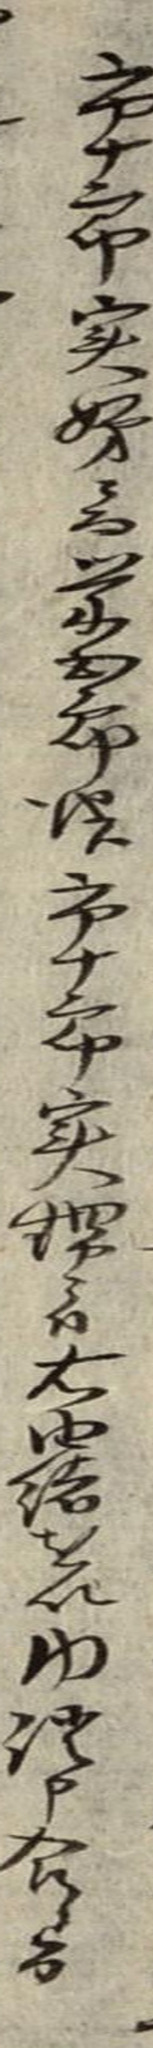市十郎実姉ニ而栄五郎儀ハ市十郎実甥ニ付右由緒を以内談申合候旨
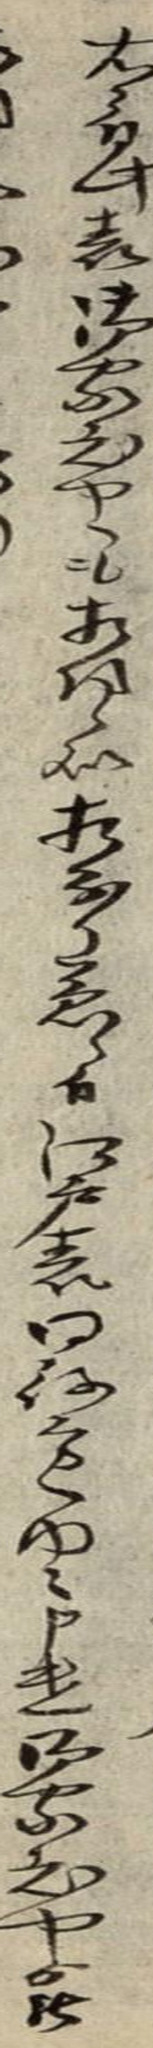右ニ付此表御家老中へも相伺候処相分り兼候付江戸表同役方へ内々申遣御家老中ゟ被
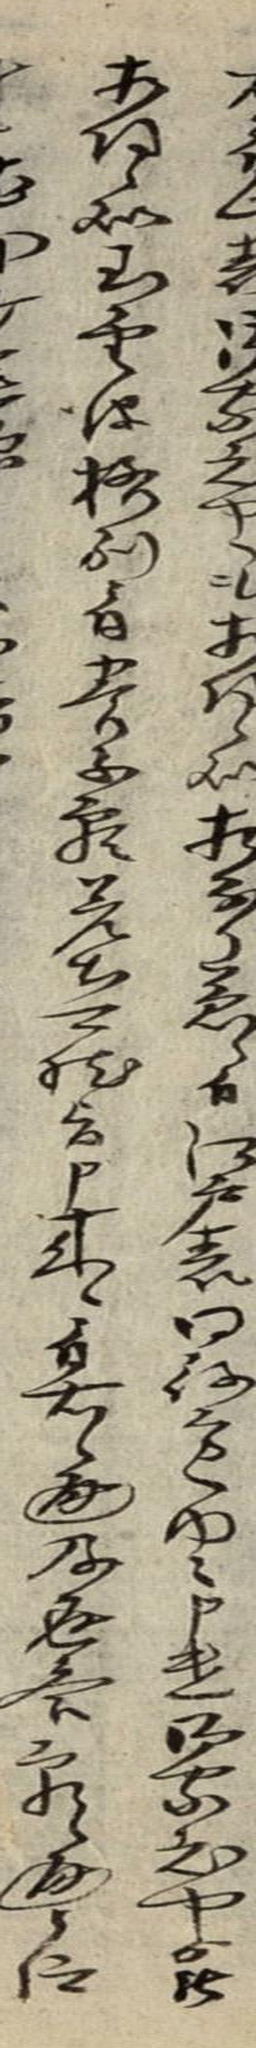相伺候処玉雲儀格別ニ付養子願差出可然旨申来候ニ付右之通及返答願之通被仰
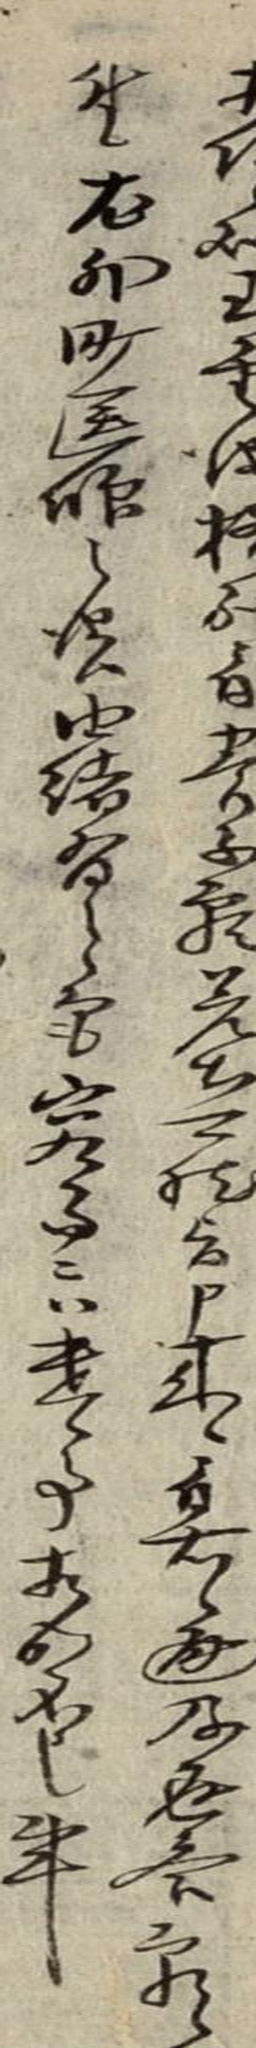付候尤外町医師之儀ハ由緒有之候而も実子ニハ遣候事相成不申候事
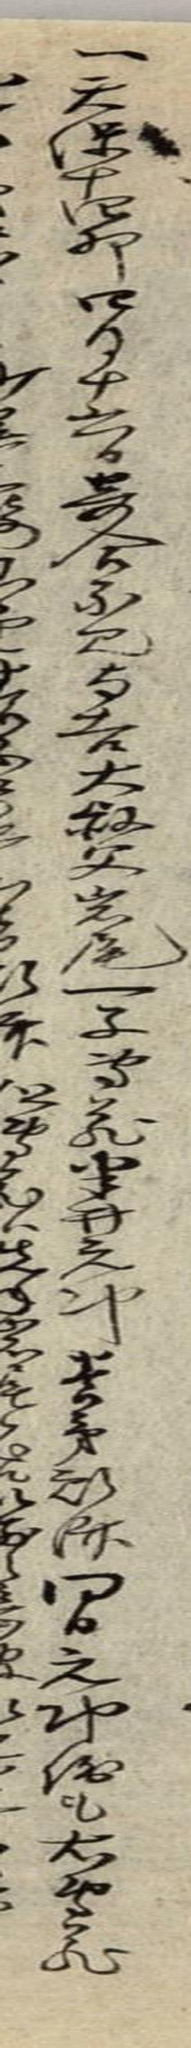一天保十四卯四月十六日寄合永見与吉大叔父岩尾一子専蔵半井元冲養弟願済同日元冲儀も右専蔵
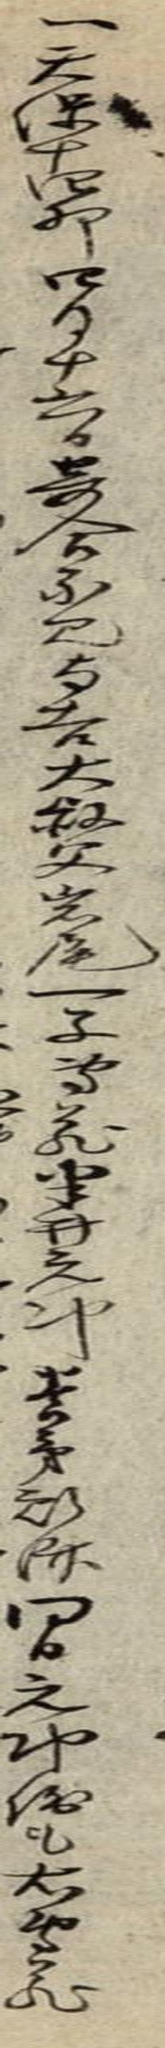一天保十四卯四月十六日寄合永見与吉大叔父岩尾一子専蔵半井元冲養弟願済同日元冲儀も右専蔵
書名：養子縁組之部
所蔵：福井県文書館 Fukui Prefectural Archives
